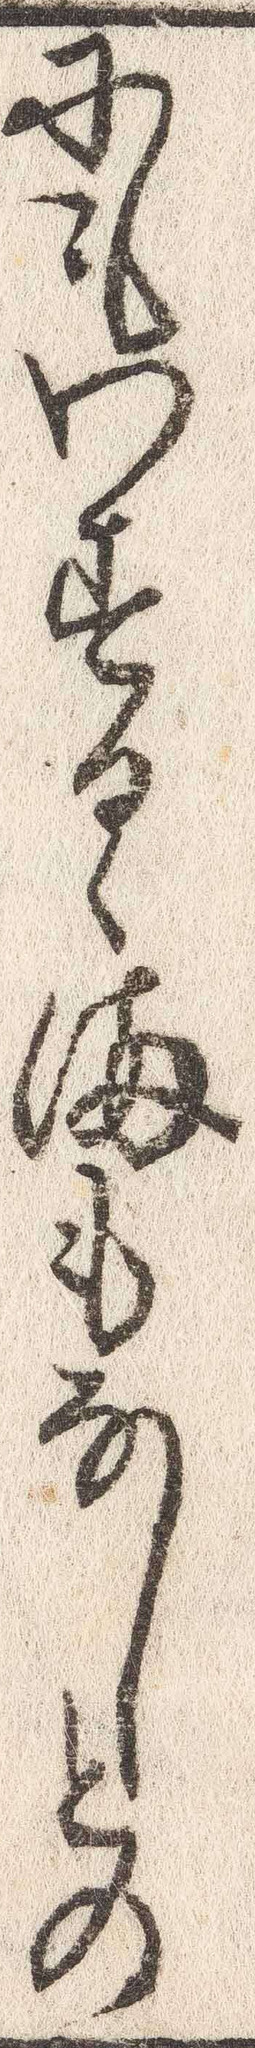にもわするゝまもなしとの
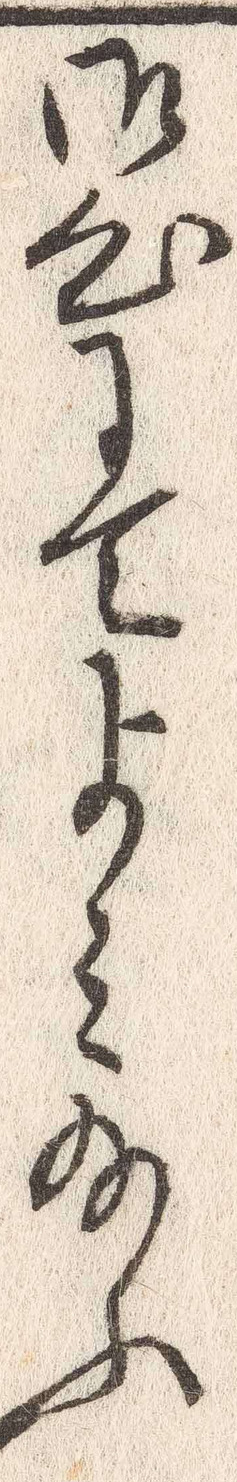御心にてよみ給ふ
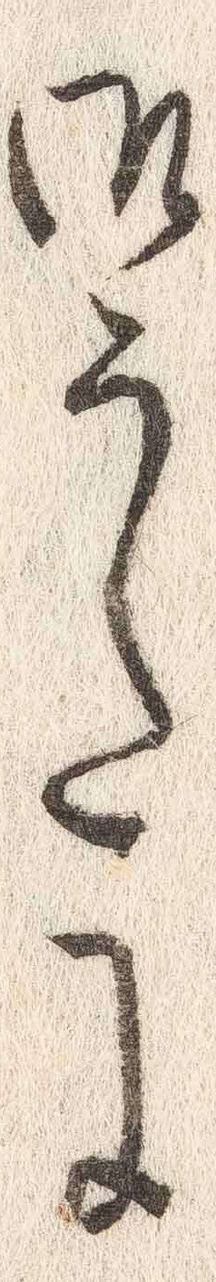御うたに
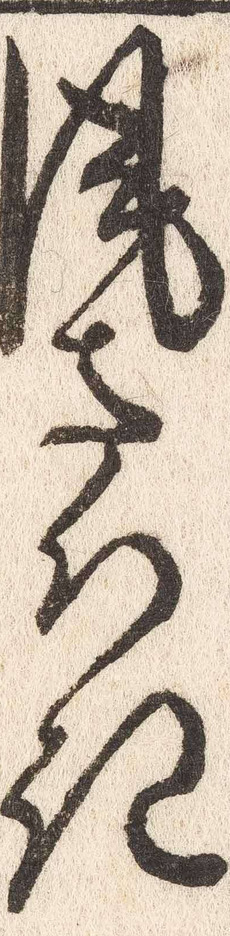風さはき
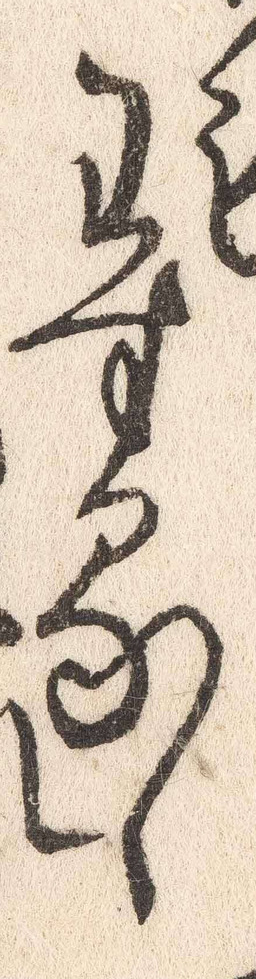わするゝ
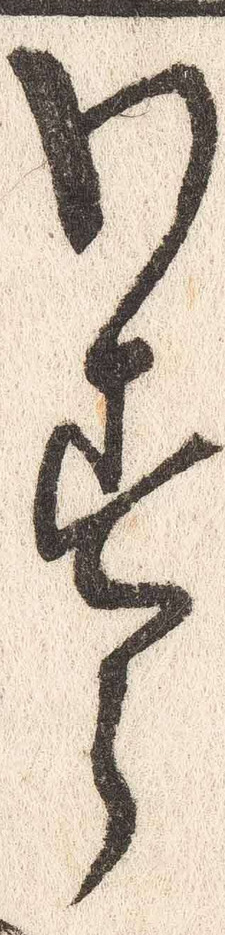わすら
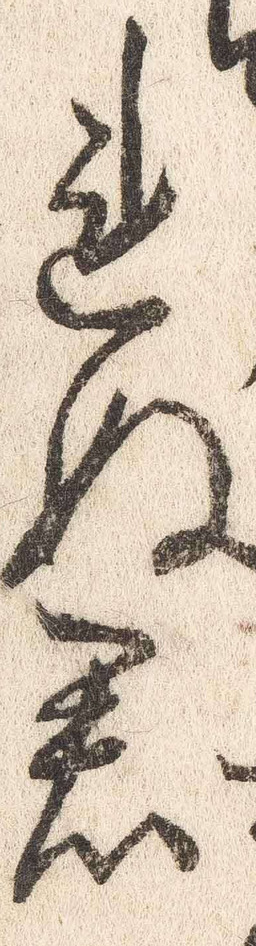れぬ君

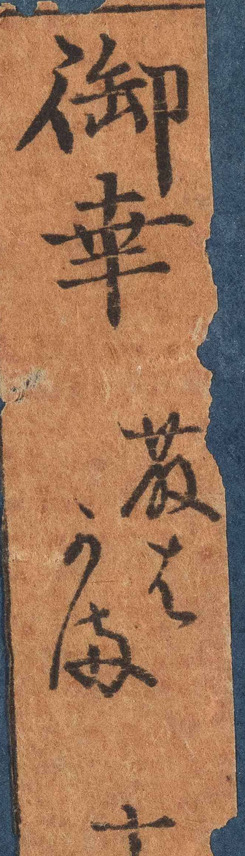御幸藤はかま十五

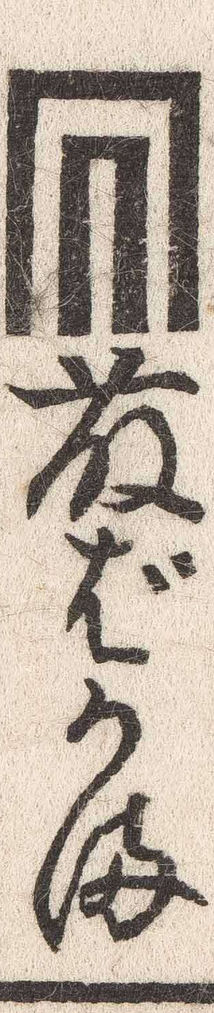藤ばかま
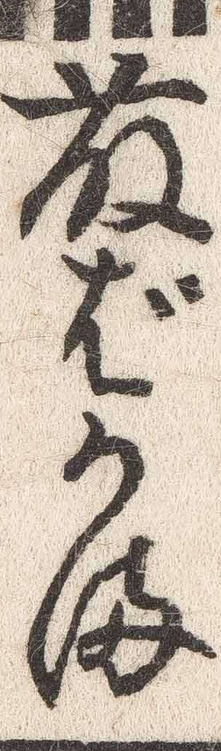藤ばかま

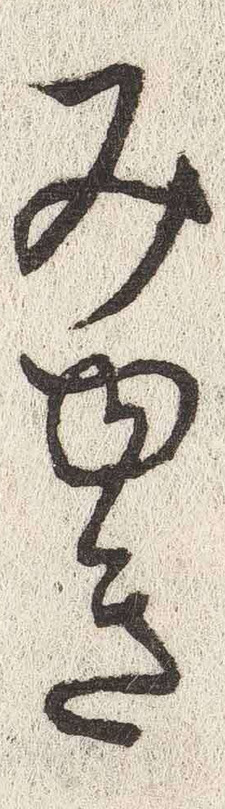みゆき
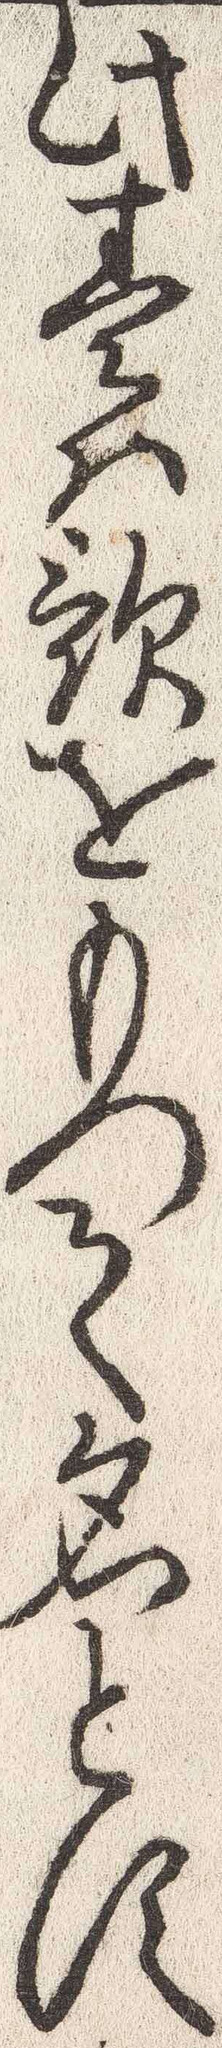此巻は歌をもつて名とす
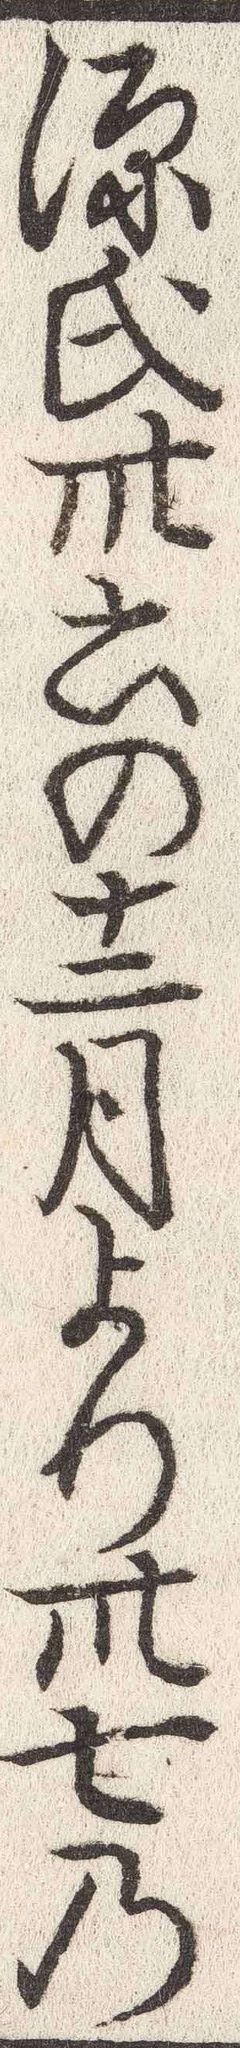源氏卅六の十二月より卅七の
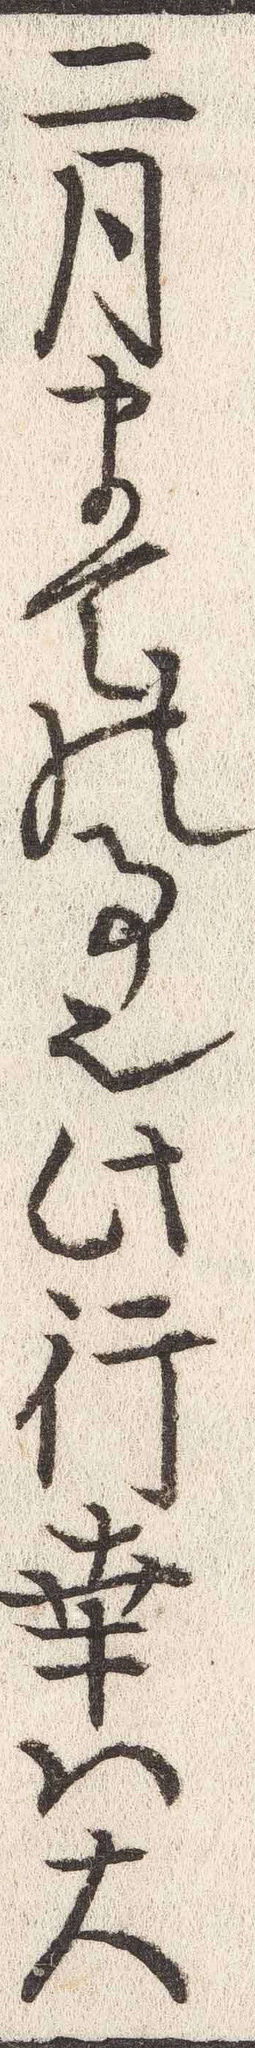二月まての事也此行幸は大
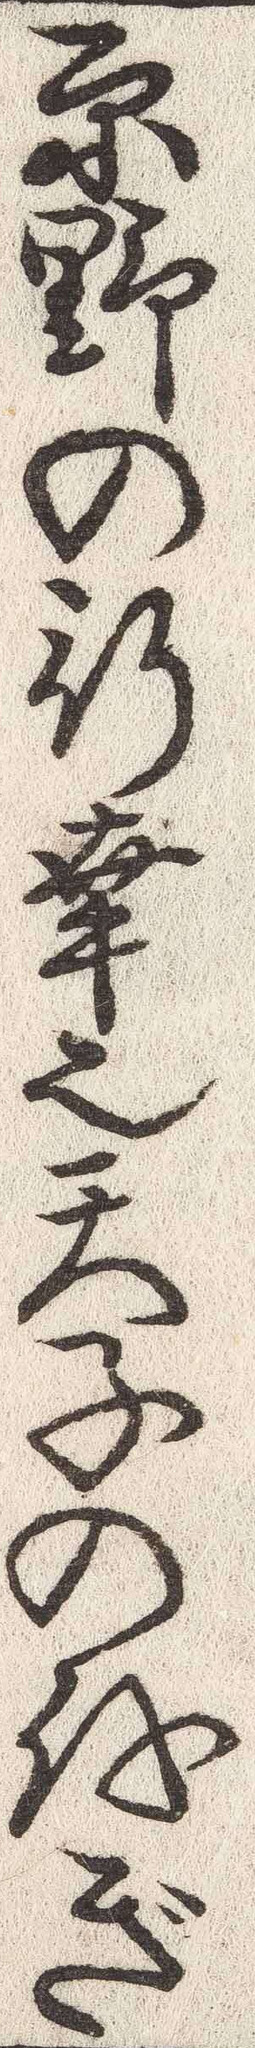原野の行幸也天子のをぎ
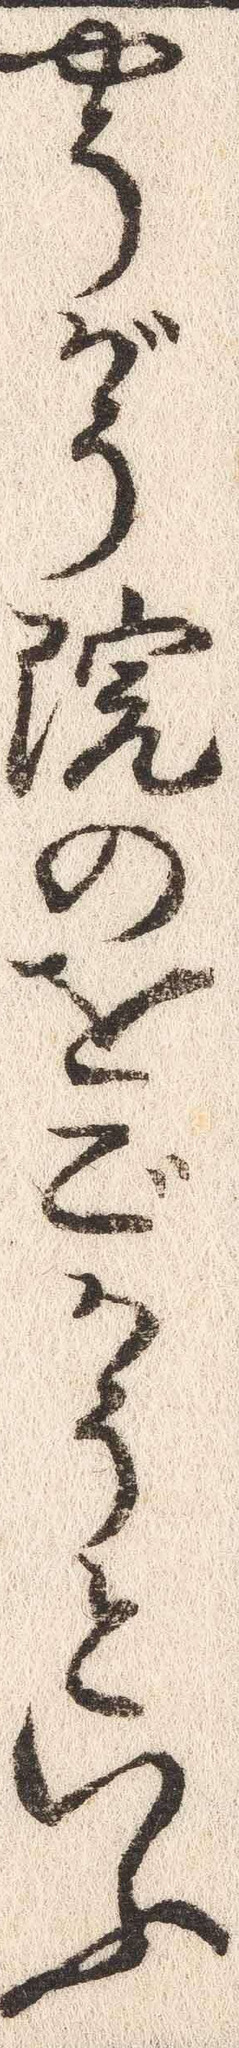やうがう院のをごかうといふ
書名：源氏物語
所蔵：東京学芸大学附属図書館 国文学研究資料館
